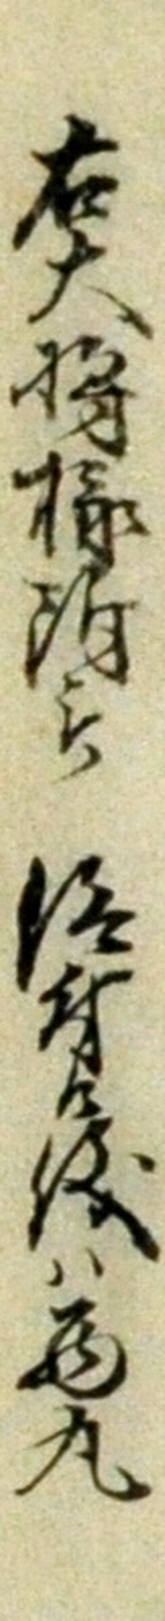右大将様附被仰付候儀ハ西丸
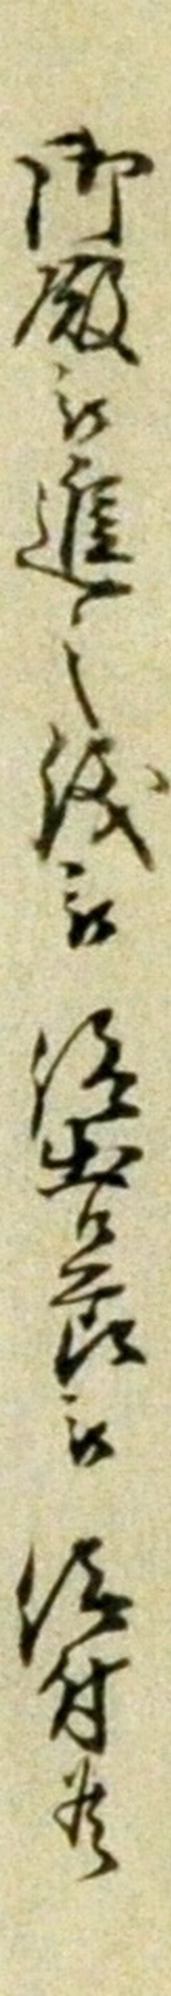御殿被進之儀被仰出候節被仰付候
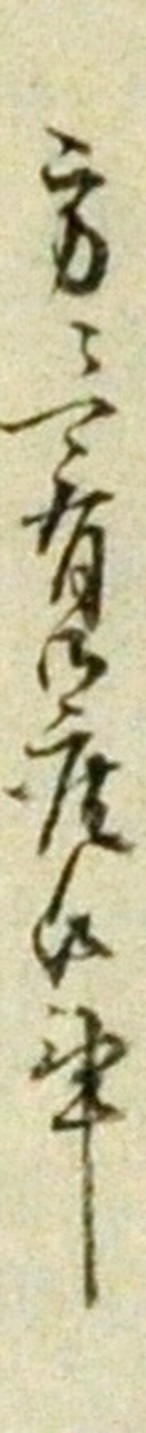方ニ可有御座候事
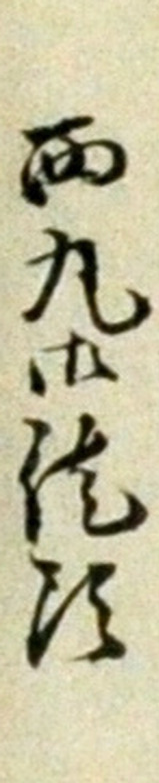西丸御徒頭
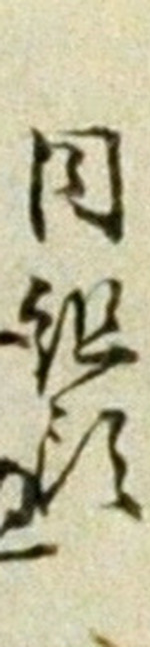同組頭
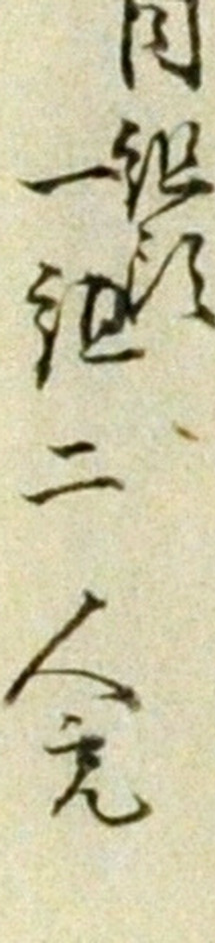一組二人充
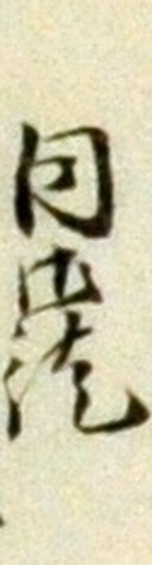同御徒
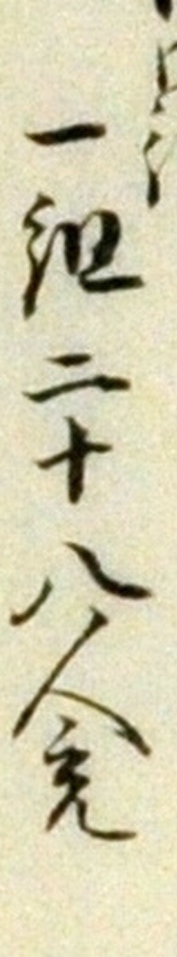一組二十八人充
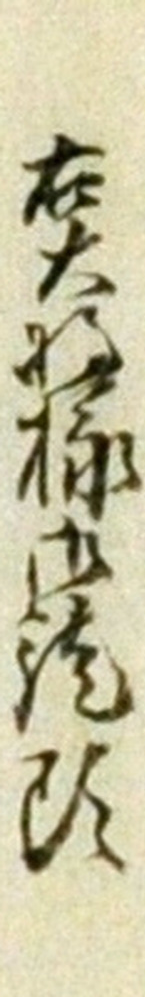右大将様御徒頭
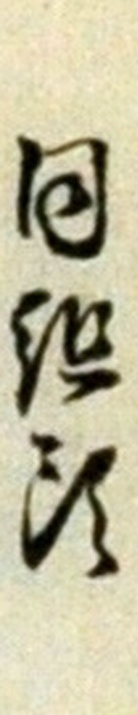同組頭
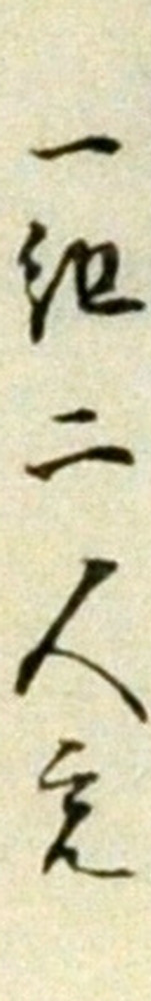一組二人充
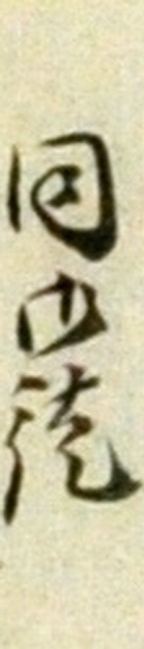同御徒
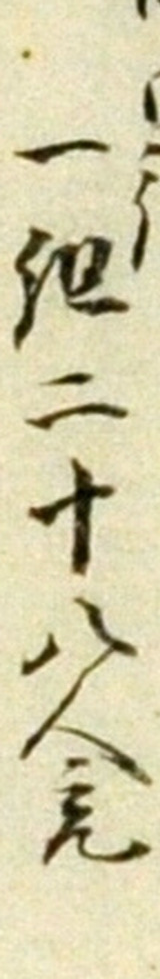一組二十八人充
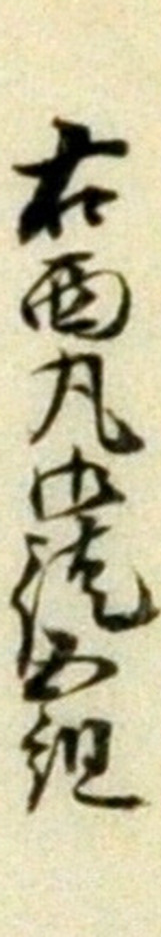右西丸御徒五組
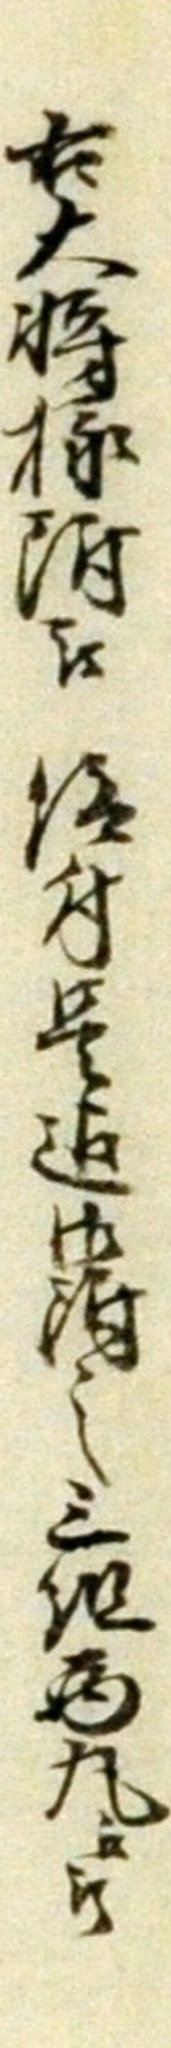右大将様附被仰付是迄御附之三組西丸江被
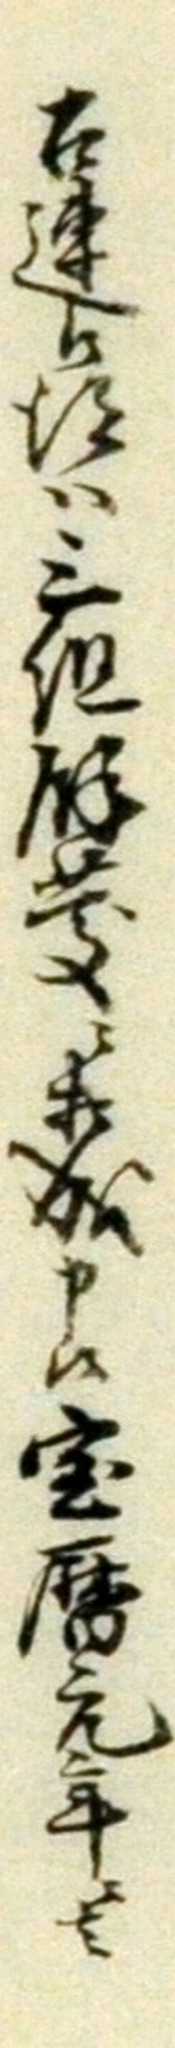召連候得ハ三組餘慶ニ相成申候宝暦元年ニ者
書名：若年寄御役中御調書付
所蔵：伊那市立高遠町図書館・合同会社AMANE
